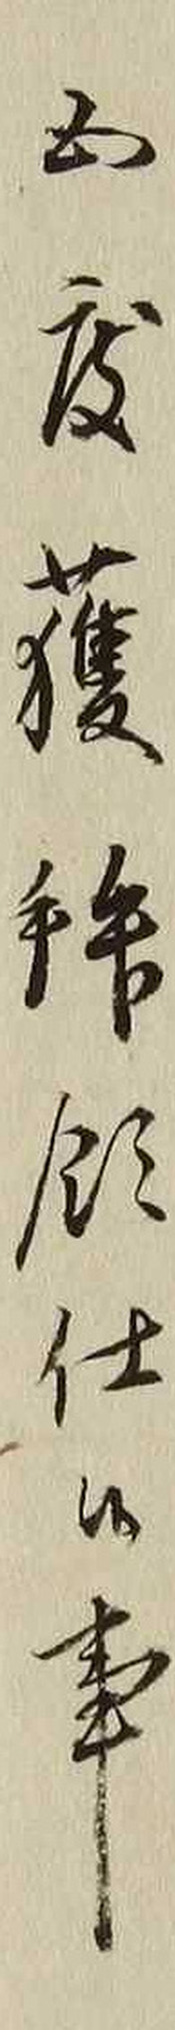五度獲拝領仕候事
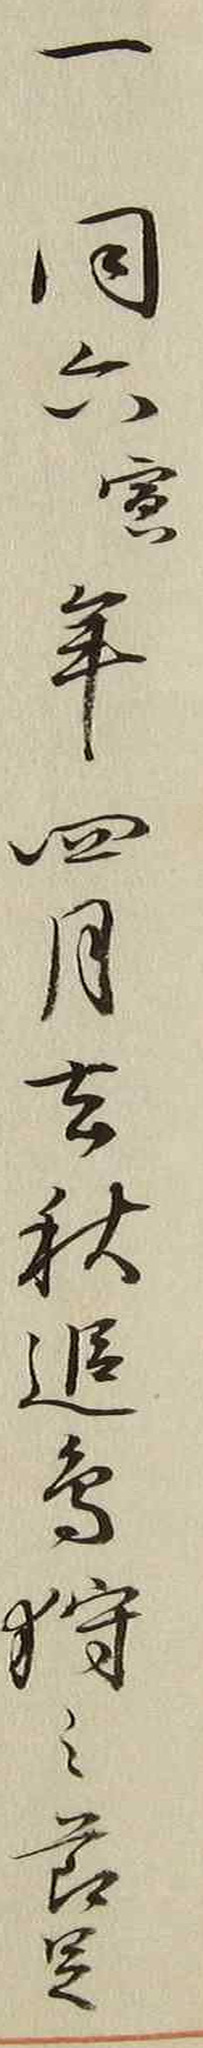一同六寅年四月去秋追鳥狩之節足
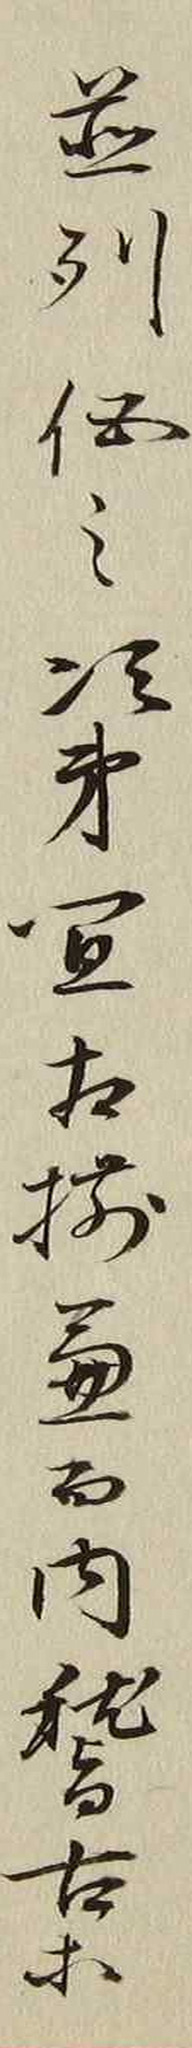並列伍之次第宜相揃兼而内稽古等
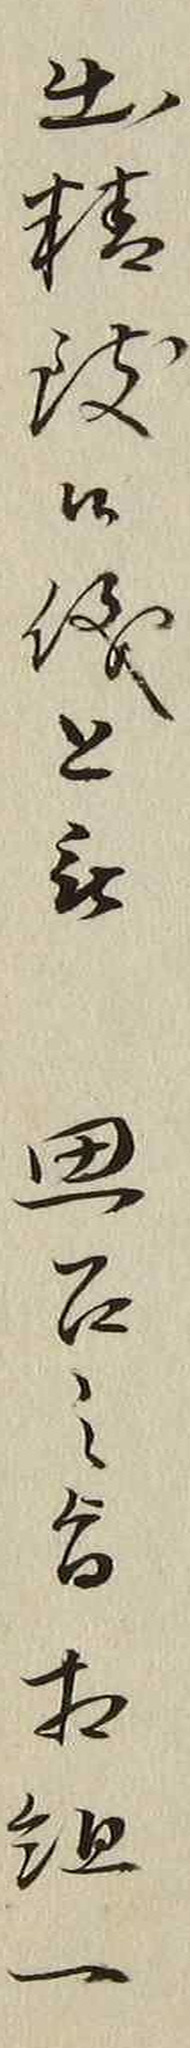出精致候儀と被思召之旨相組一
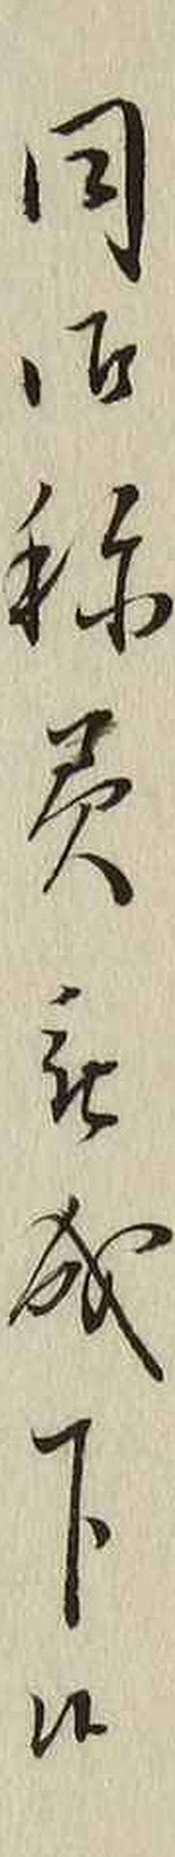同御称美被成下候
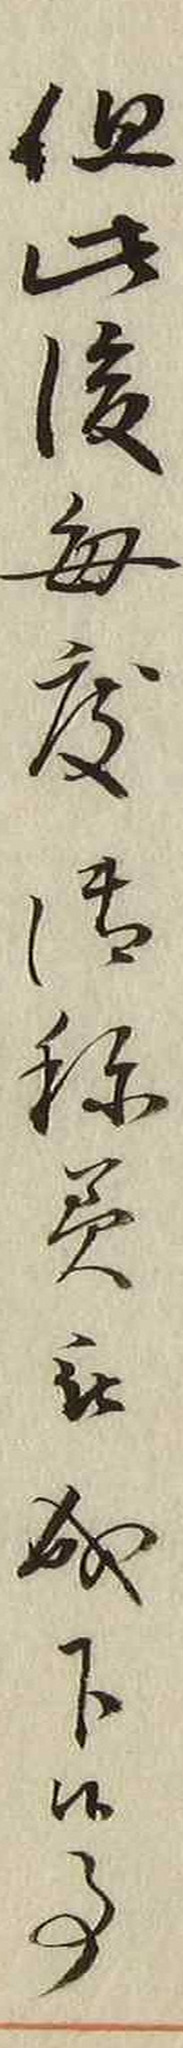但此後毎度御称美被成下候事
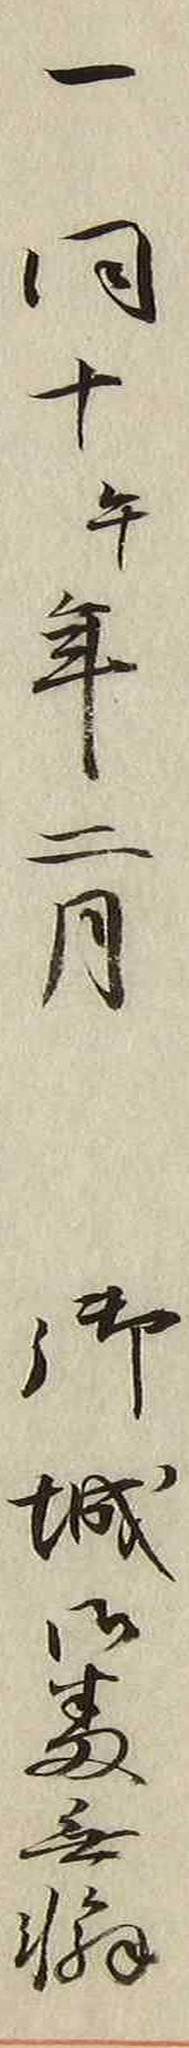一同十午年二月御城御番無懈
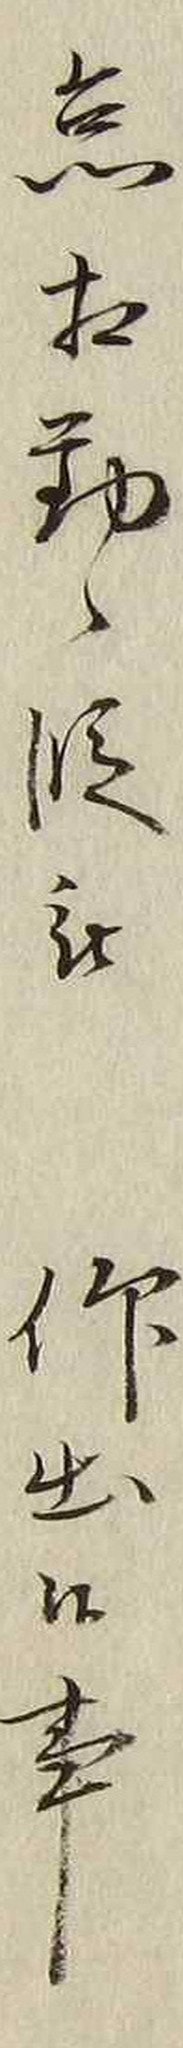怠相勤候段被仰出候事
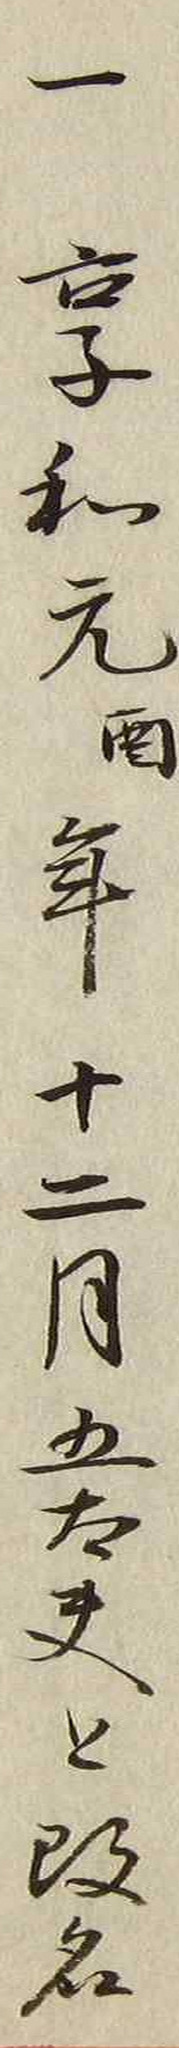一享和元酉年十二月五太夫と改名
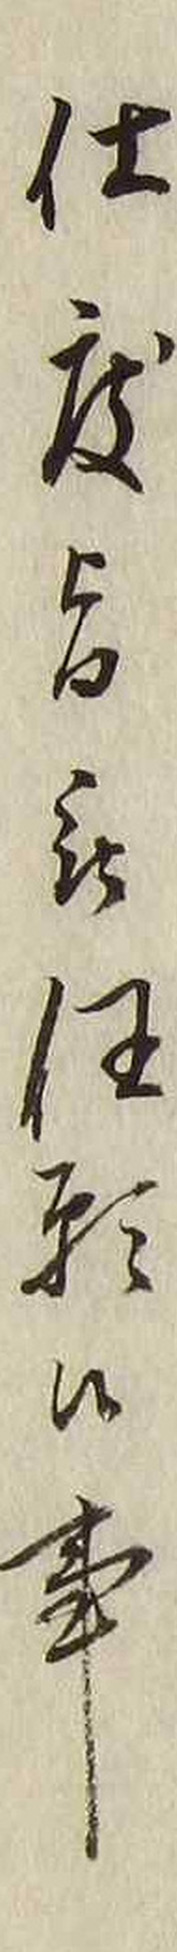仕度旨被任願候事
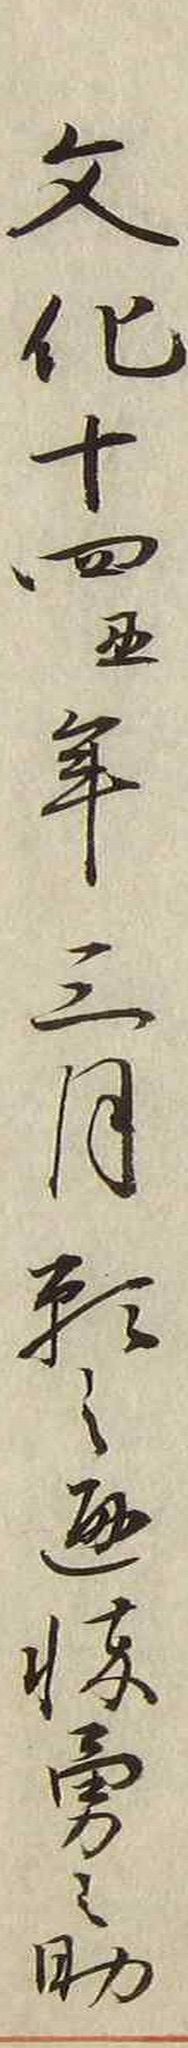一文化十四丑年三月願之通悴勇之助

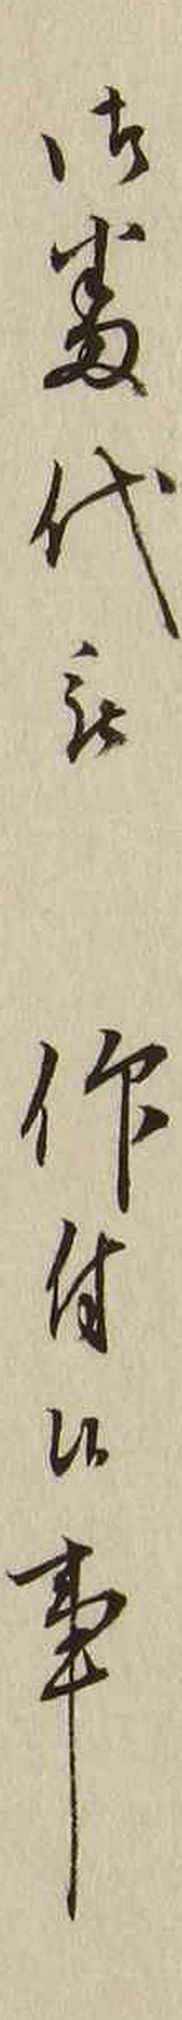御番代被仰付候事
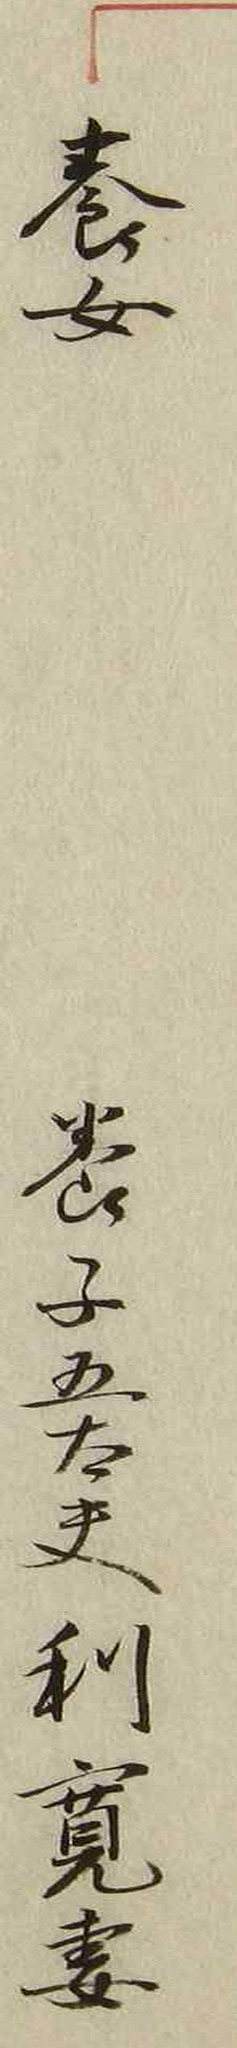養女養子五太夫利寛妻
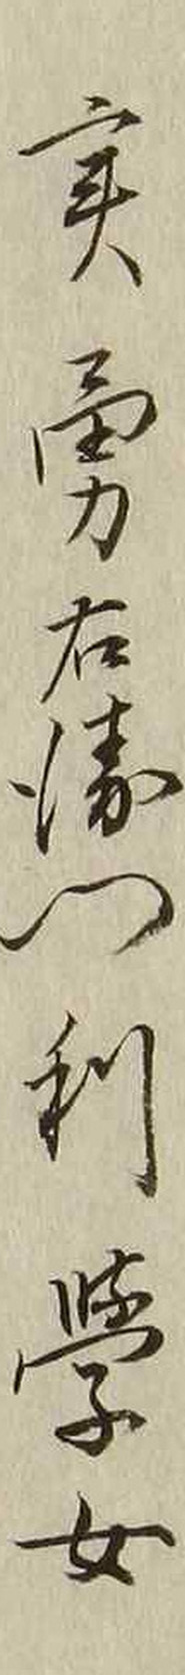実勇右衛門利学女
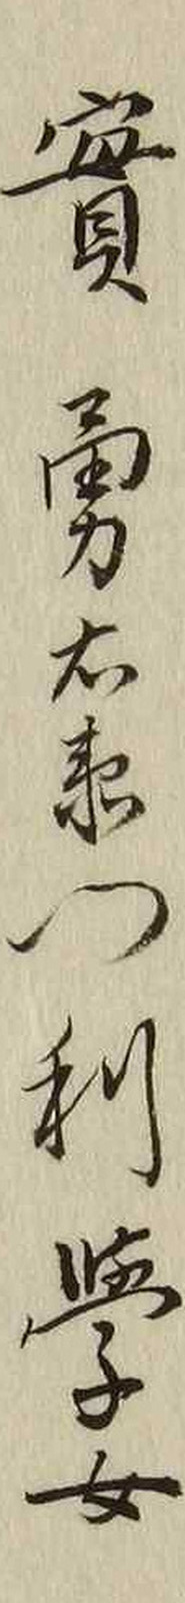実勇右衛門利学女
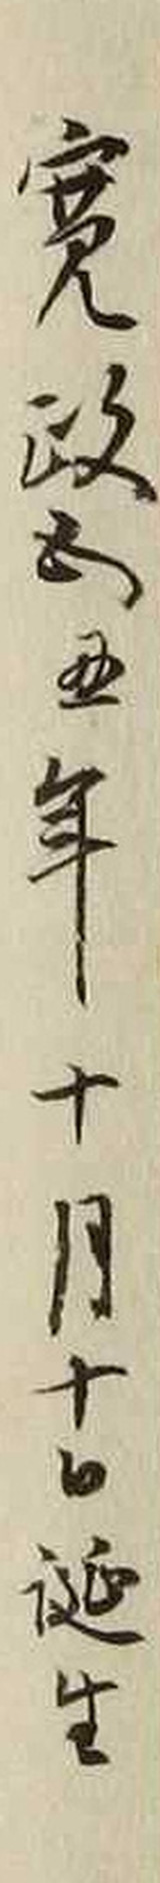寛政五丑年十月十日誕生
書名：諸士系譜　巻之22　い之部22
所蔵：会津若松市立会津図書館
